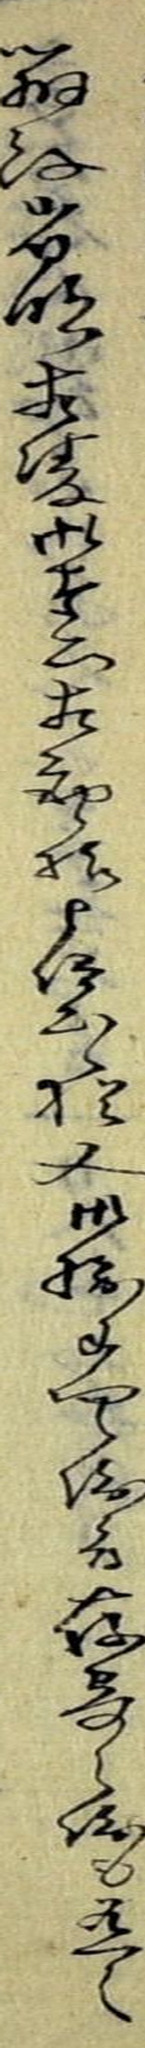弁致省略相凌御奉公相勤候様被仰出候猶又御勝手向之儀に付存寄之儀も有之
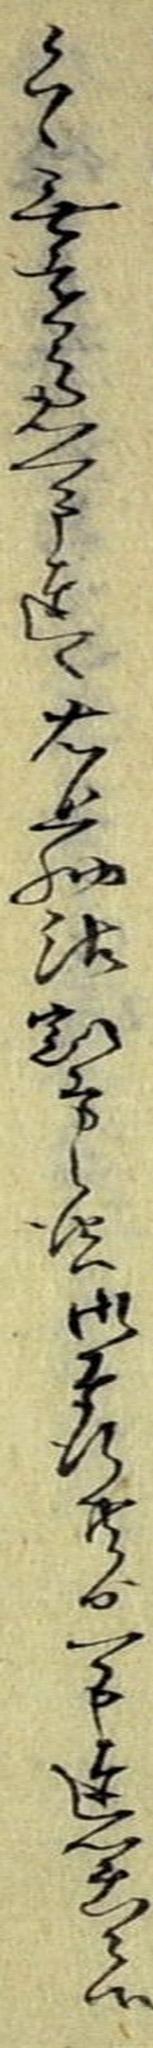候はヽ無遠慮可申達候右上納銀割方之儀は御奉行共ゟ可申達筈に候
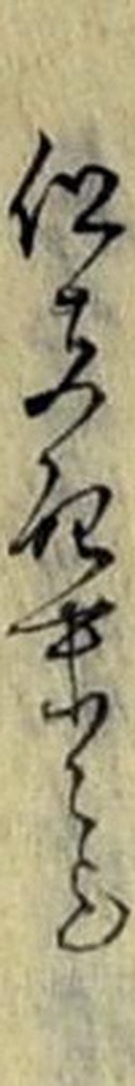但支配末々迄
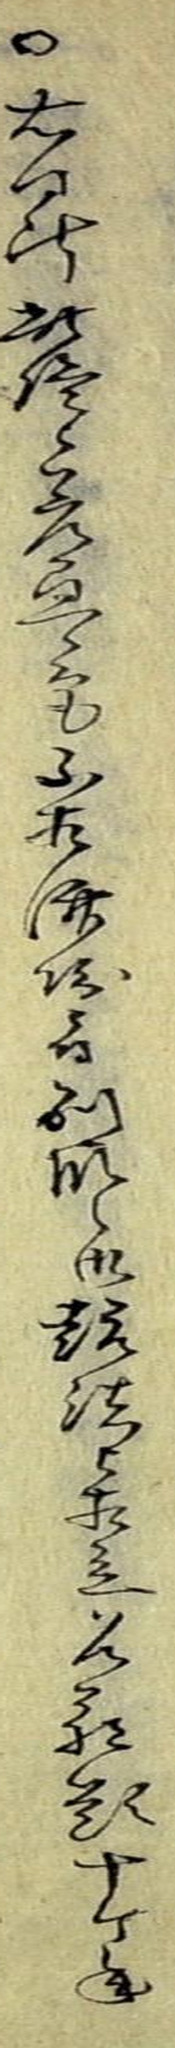○右同断此侭被差置候而も不相済儀に付別段之御趣法被相立乍難題十ヶ年
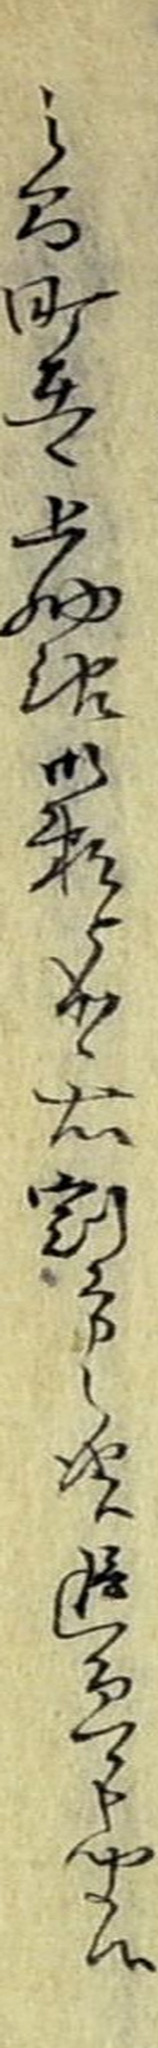之間町在へ上納銀御頼被成候右割方之儀は追而可申聞候
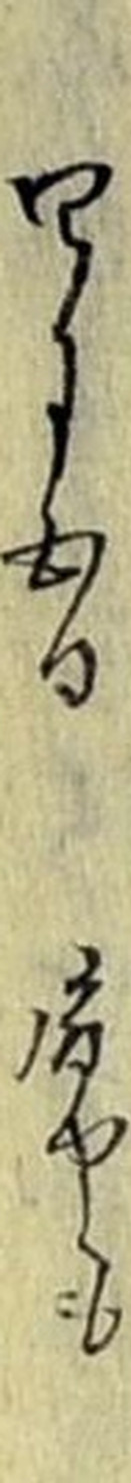四月五日府中へも
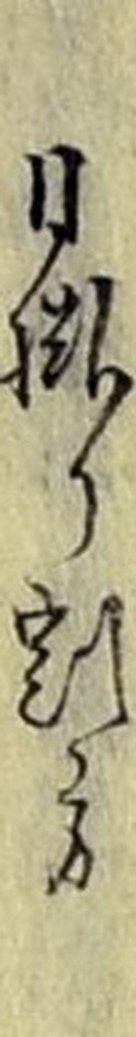日掛り割方
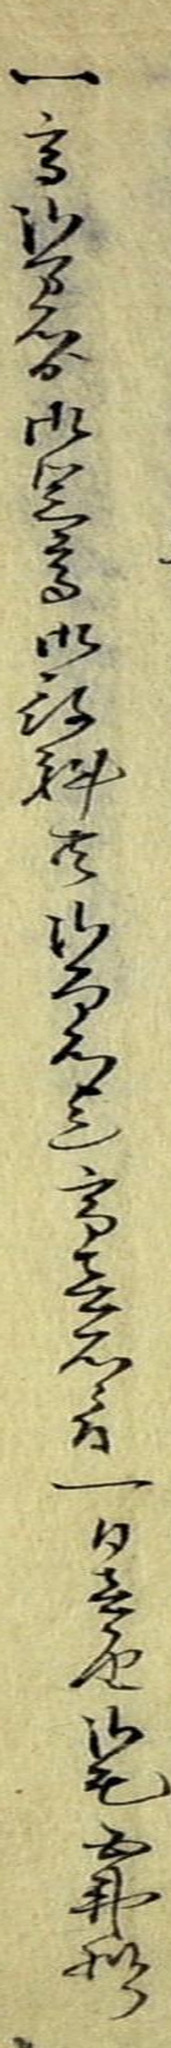一高弐万石ゟ御足高御役料共弐百石迄高壱石に付一日壱厘弐毛五弗掛り
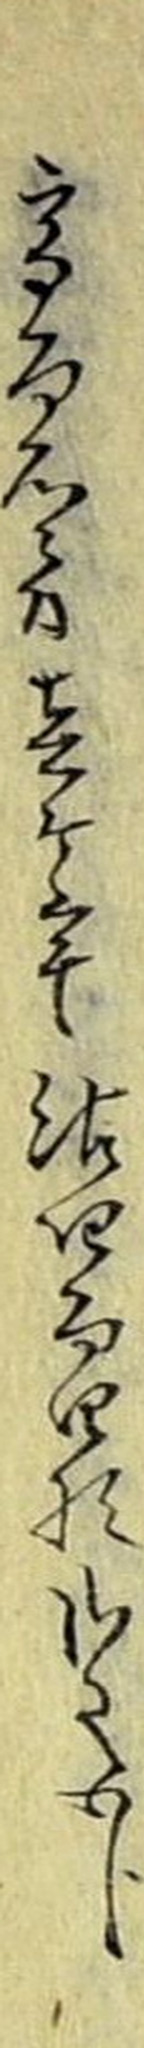高百石に付壱ヶ年銀四百四拾弐匁五分
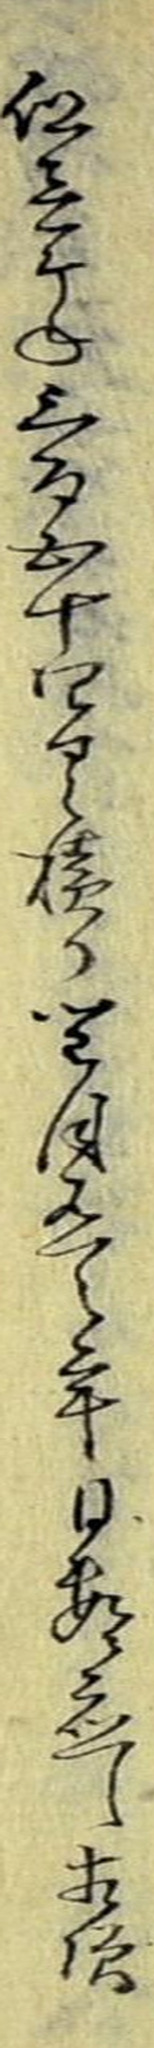但壱ヶ年三百五十四日之積り閏月有之年日数に応し相増

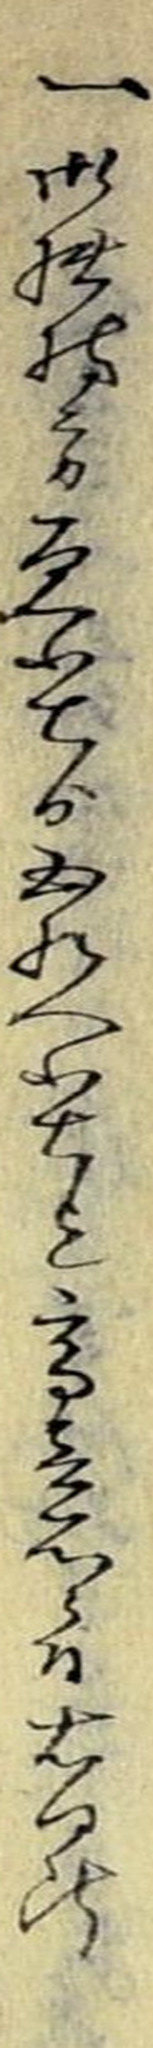一御扶持方百人ふちゟ五拾人ふち迄高壱石に付右同断
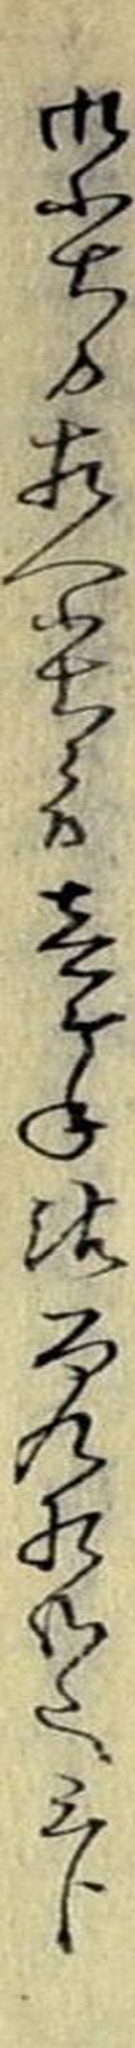御ふち方拾人ふちに付壱ヶ年銀百九拾弐匁三分
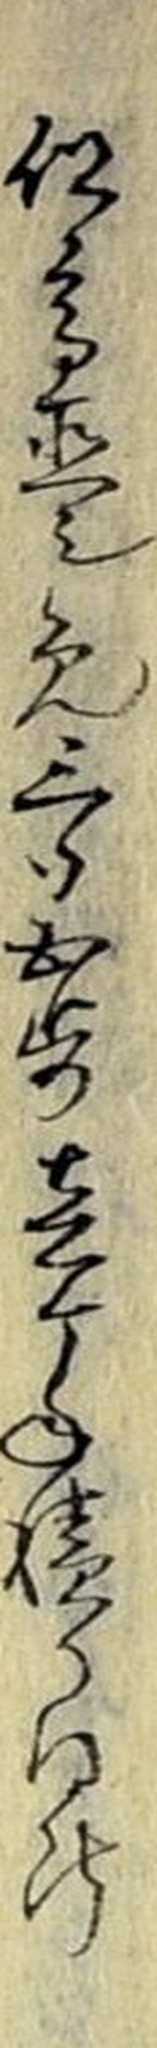但高直し免三ッ五歩壱ヶ年積り同断
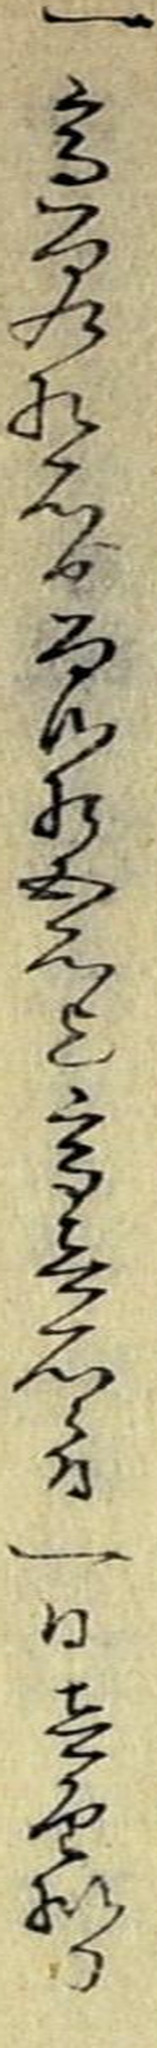一高百九拾石ゟ百弐拾五石迄高一石に付一日壱厘掛り
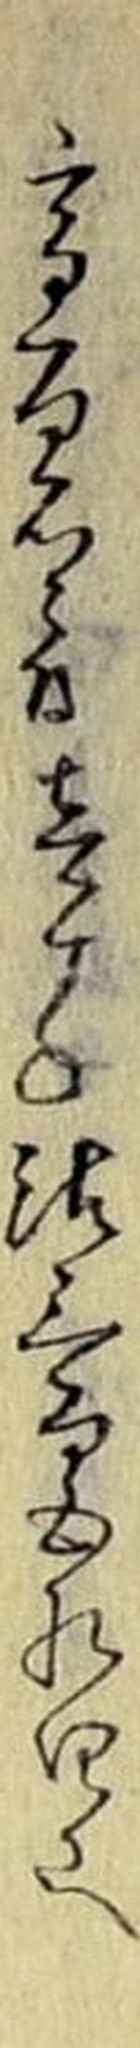高百石に付壱ヶ年銀三百五拾四匁
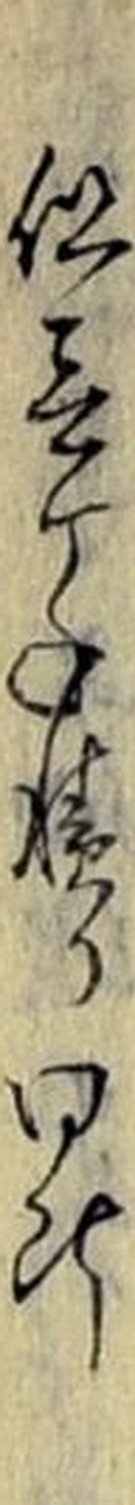但壱ヶ年積り同断
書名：命令之部 六
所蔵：福井県文書館 Fukui Prefectural Archives
